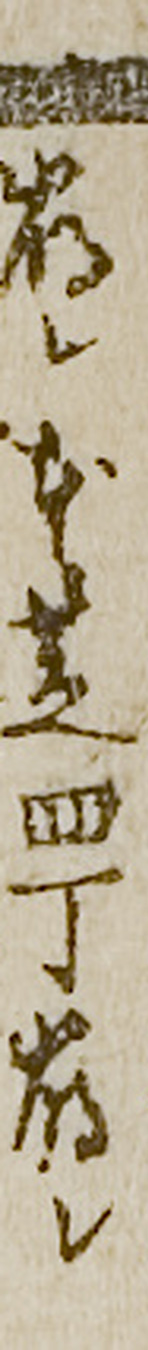崩れ本芝四丁崩れ
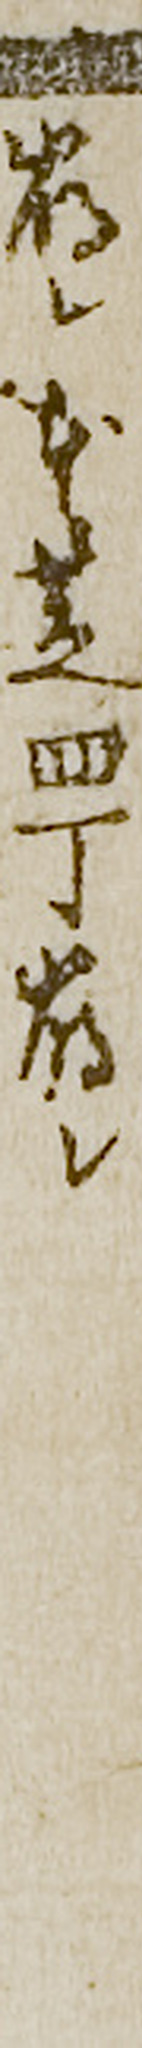崩れ本芝四丁崩れ
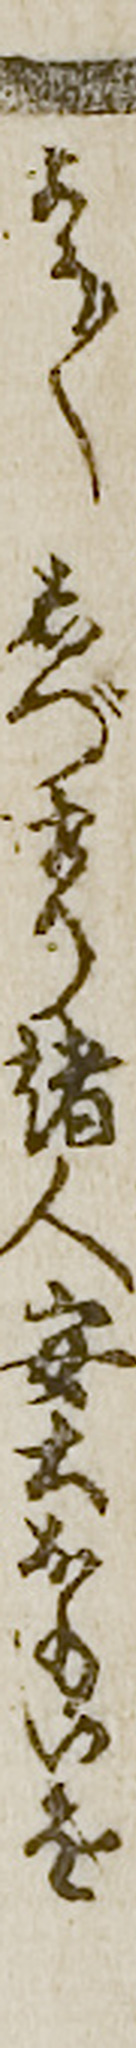よう〳〵しづまり諸人安土おもいを
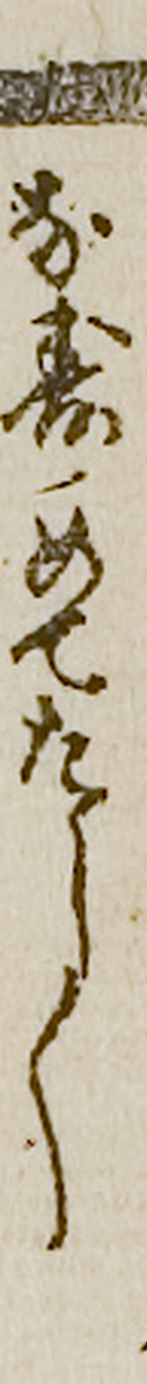なすめでたし〳〵
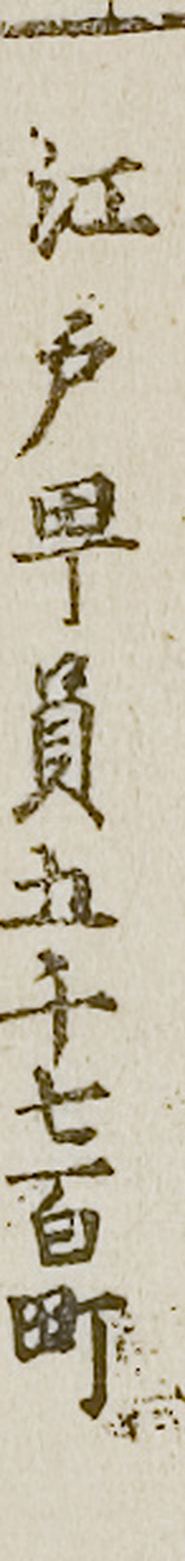江戸町員五千七百町
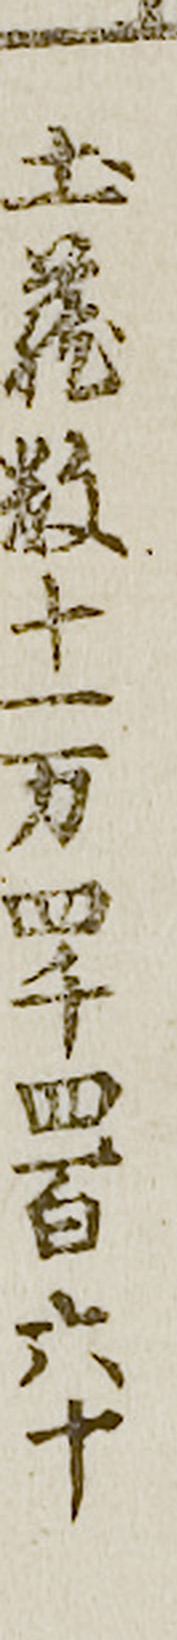土蔵数十一万四千四百六十
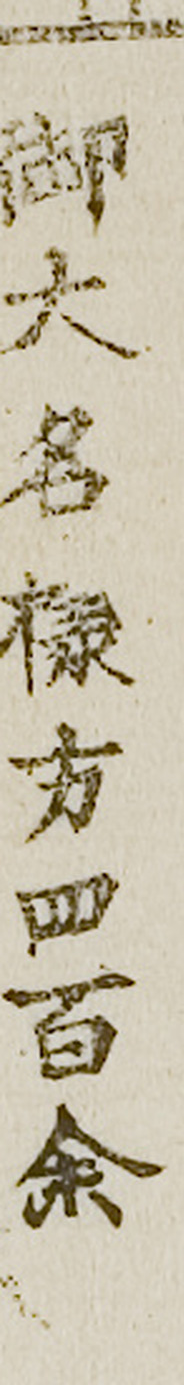御大名様方四百余
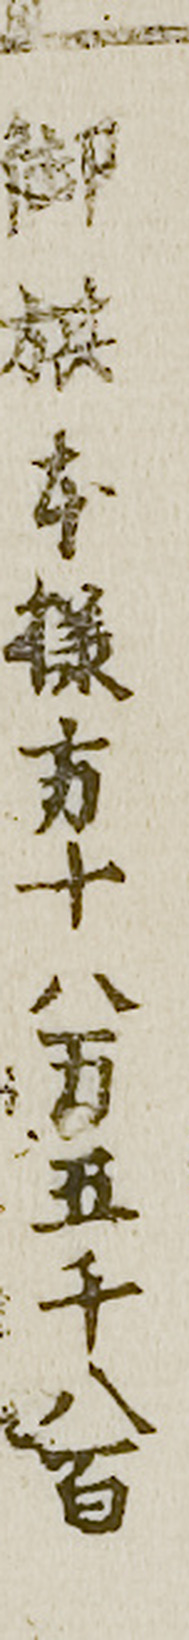御旗本様方十八万五千八百
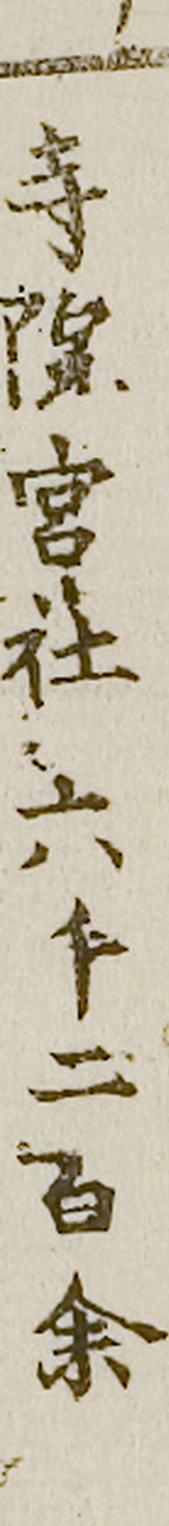寺院宮社六千二百余
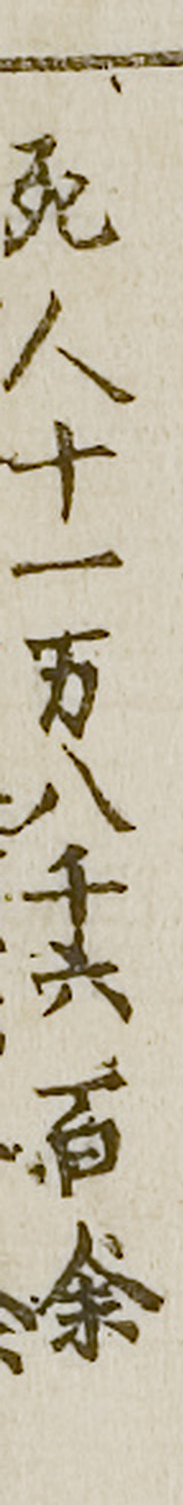死人十一万八千六百余
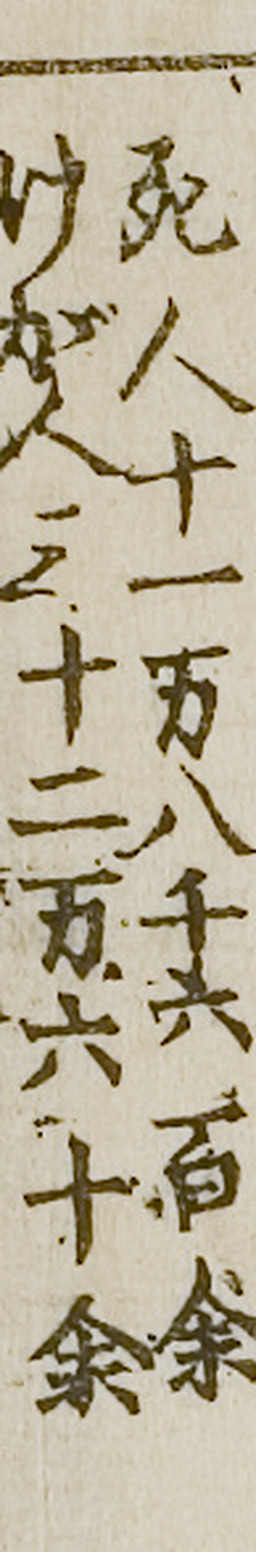けが人三十二万六十余
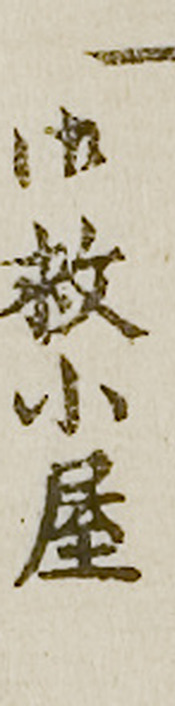御救小屋
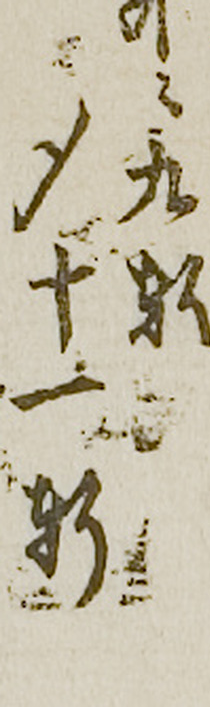〆十一軒
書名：江戸大地震出火場所附
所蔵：東京大学総合図書館 General Library in the University of Tokyo, JAPAN
